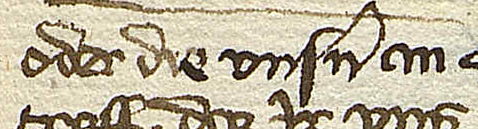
oder die vnſ*n an
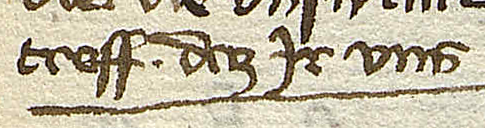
treff . daʒ Ir vns
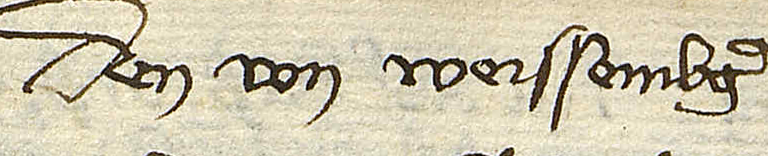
Den von weiſſemb*g
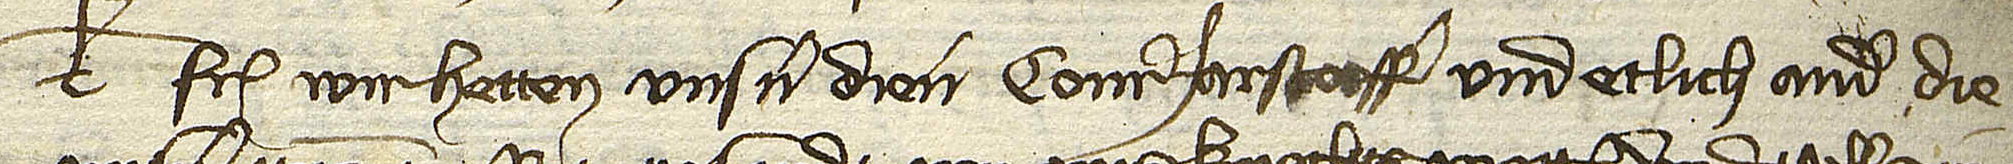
L* fr* wir hetten vnſ*n dien* Conr* Iarſtorff* vnd etlich and* die
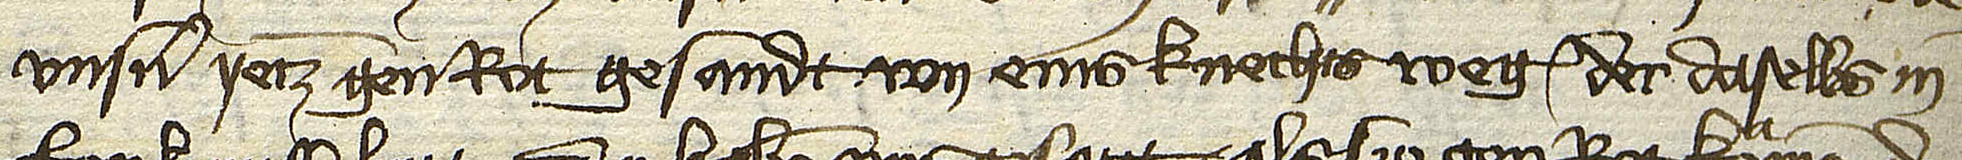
vnſ*n yecʒ* gen Rot geſandt von eins knechts weg* der daſelbs in
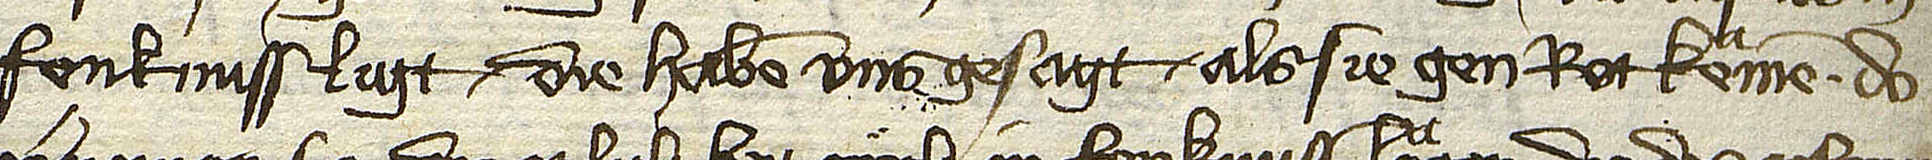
fenknuſſ ligt / die habe* vns geſagt / als ſie gen Rot këme* . do
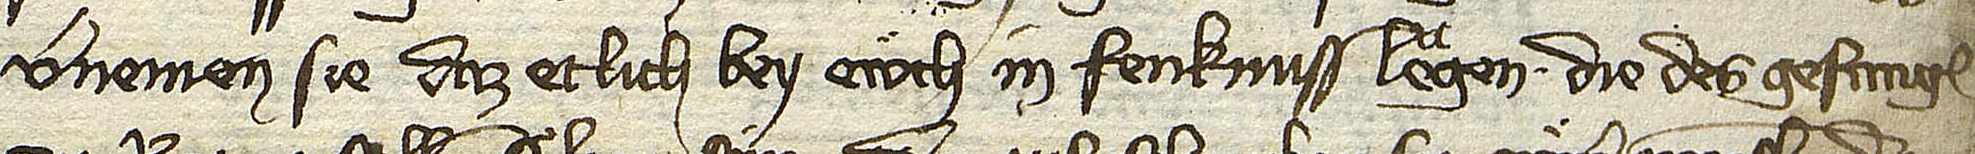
v*nemen ſie daʒ etlich bey ewch in fenknuſſ lëgen . die des gefang*
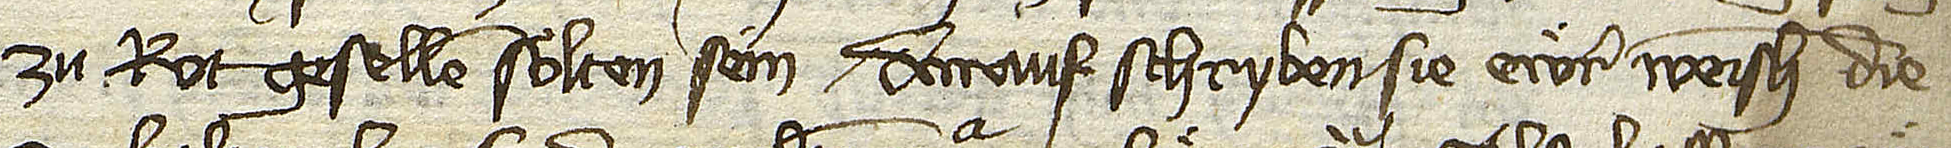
ʒu Rot geſelle* ſolten ſein / Darauf ſchryben ſie ew*r weiſh* die
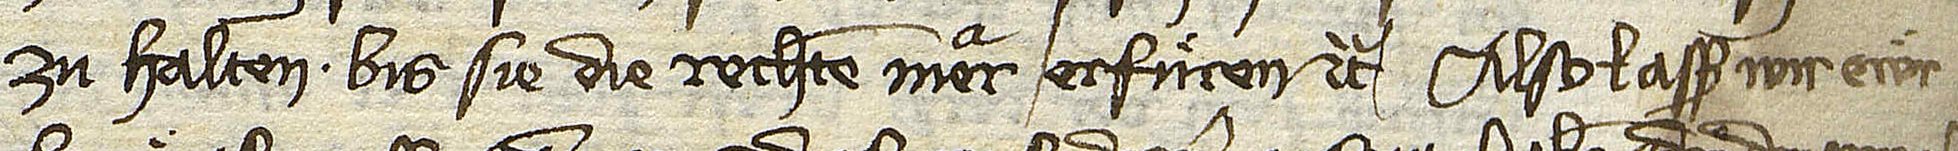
ʒu halten . bis ſie die rechte* mër erfüren ec* Alſo laſſ* wir ewr
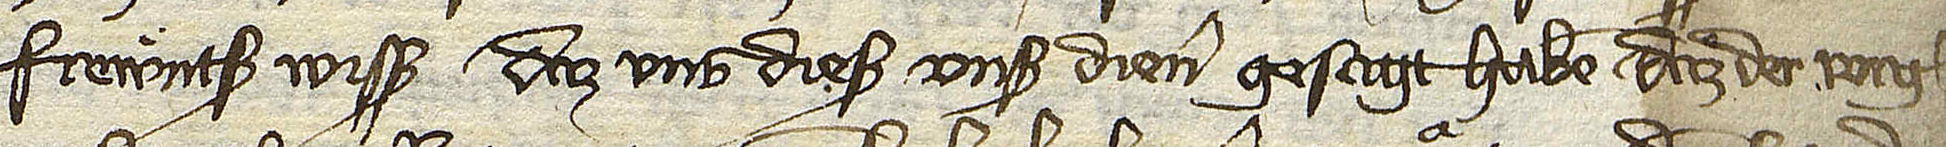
frewntſ* wiſſ* / daʒ vns dieſ* vnſ* dien* geſagt habe* / daʒ der vorg*
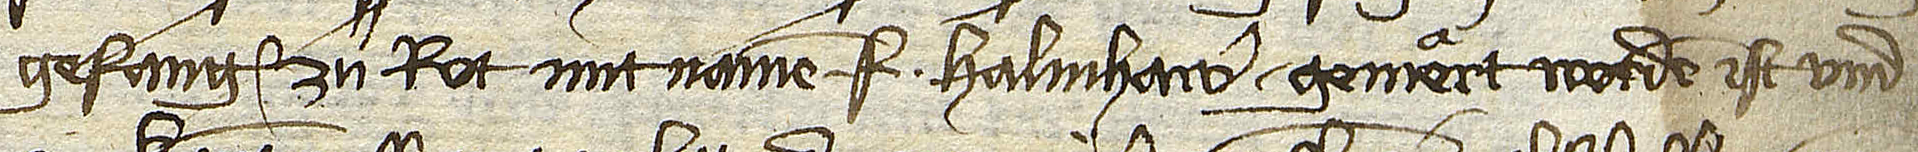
gefang* ʒu Rot mit name* . F . Halmhaw* / gemërt worde* iſt vnd
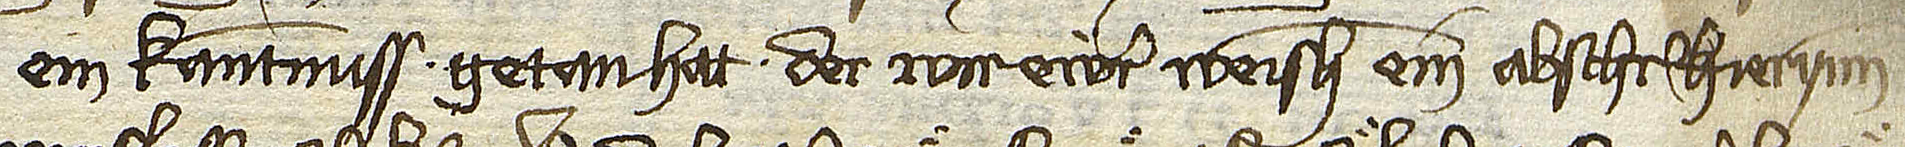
ein kantnuſſ* . getan hat . der wir ew*r weiſh* ein abſchr* hierynn*
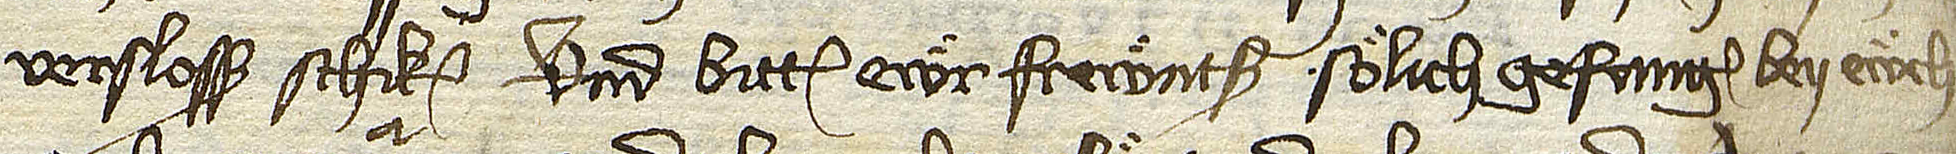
verſloſſ* ſchik* Vnd bitt* ewr frewntſ* . ſölich gefang* bey ewch
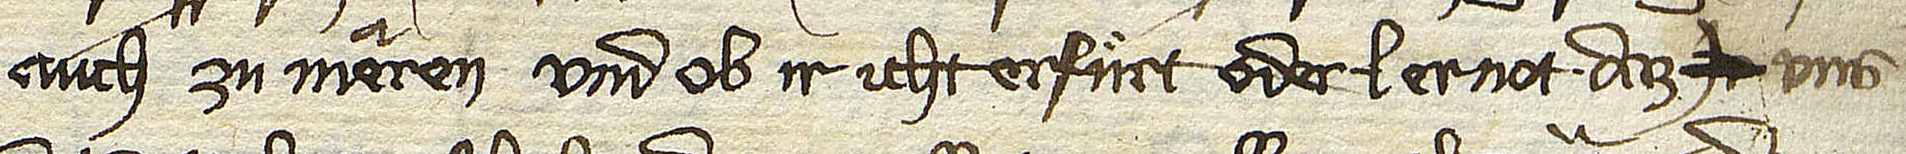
auch ʒu mëren vnd ob ir icht erfürt oder lernot . daʒ Ir vns
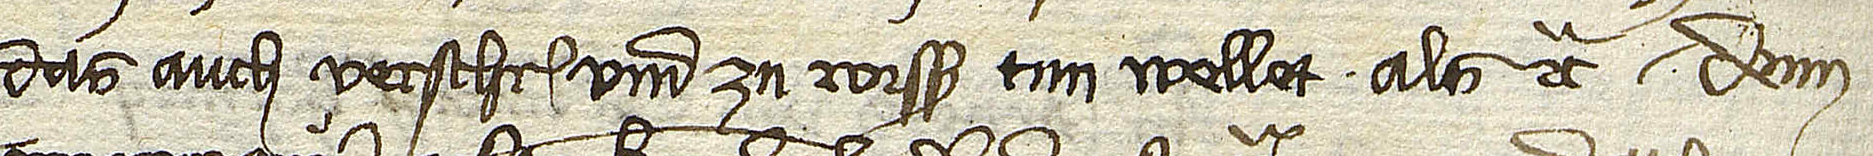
das auch verſchr* vnd ʒu wiſſ* tun wellet . als ec* / . Denn
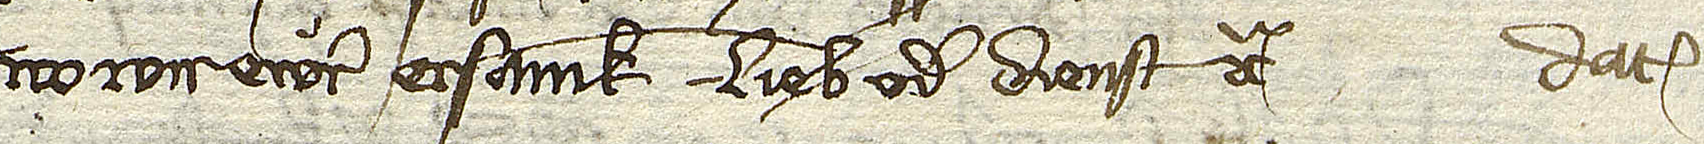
wo wir ewr* erſamk* lieb od* dienſt ec* dat*
